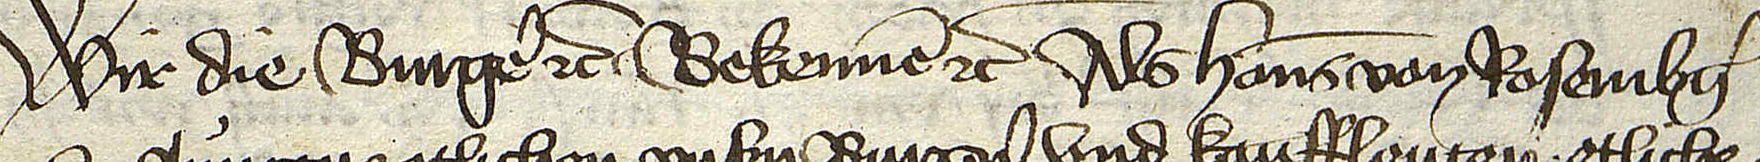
Wir die Burge* ec* Bekenne* ec* Als hans* von Roſembg*
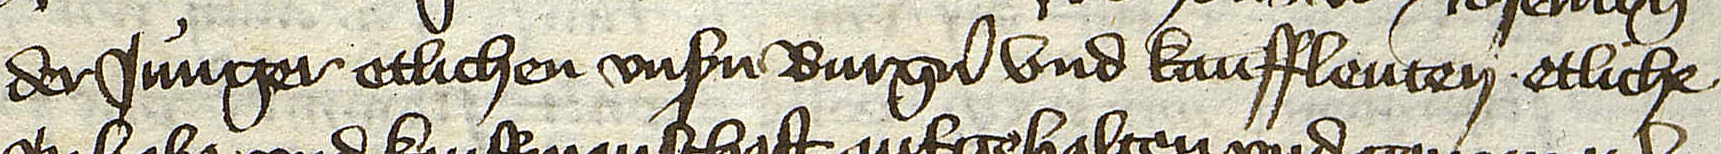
der Iünger etlichen vnſ*n Burgn* vnd kauffleuten . etliche
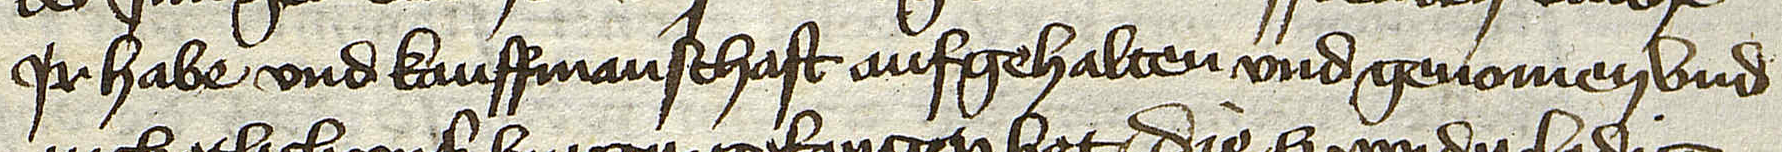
Ir habe vnd kauffmanſchaft aufgehalten vnd genomen vnd
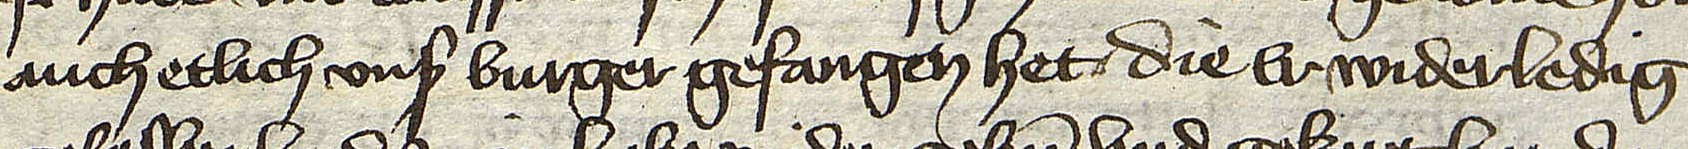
auch etlich vnſ* burger gefangen het / die Er wider ledig
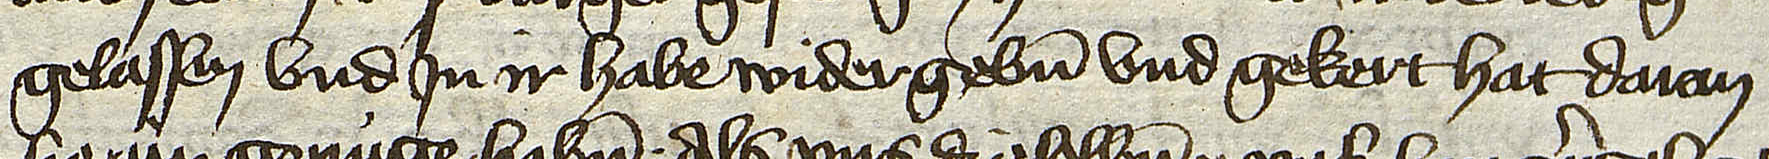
gelaſſen vnd In ir habe wider gebn* vnd gekert hat daran
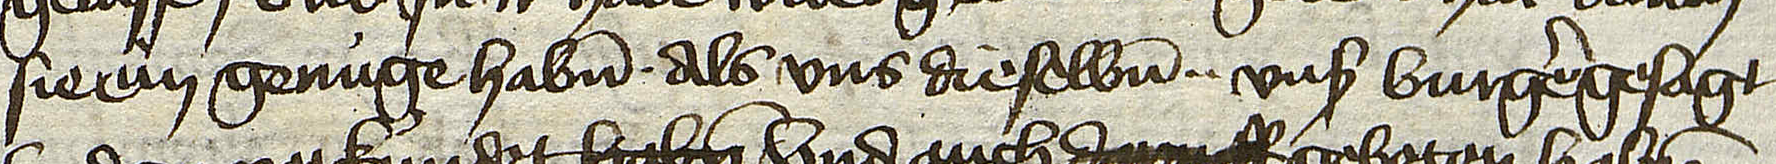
ſie ein genüge habn* . Als vns dieſelbn* ~ vnſ* burge* geſagt
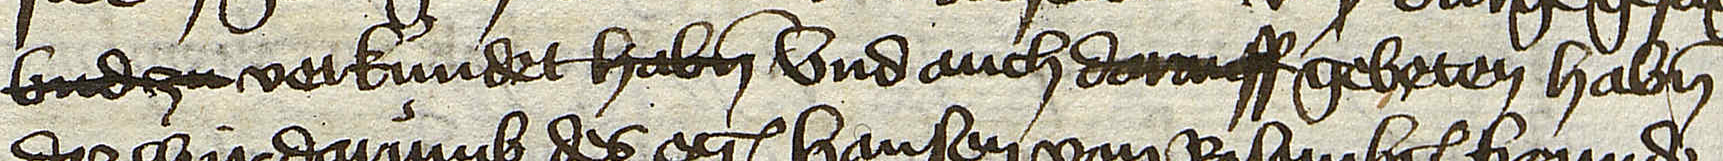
vnd cʒu verkündet habn* vnd auch darauff gebeten habn*
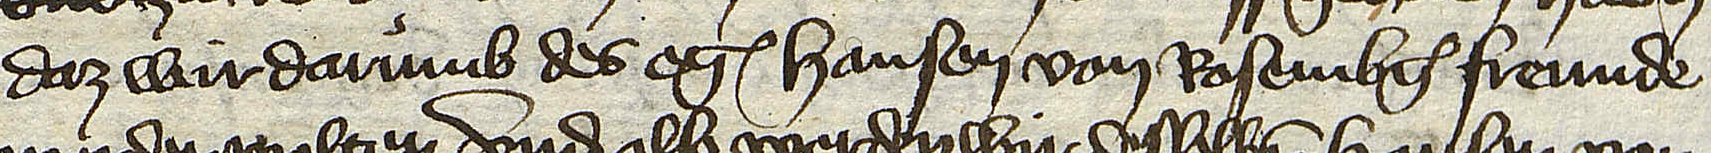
daʒ wir darümb des eg* hanſen von Roſembg* freunde
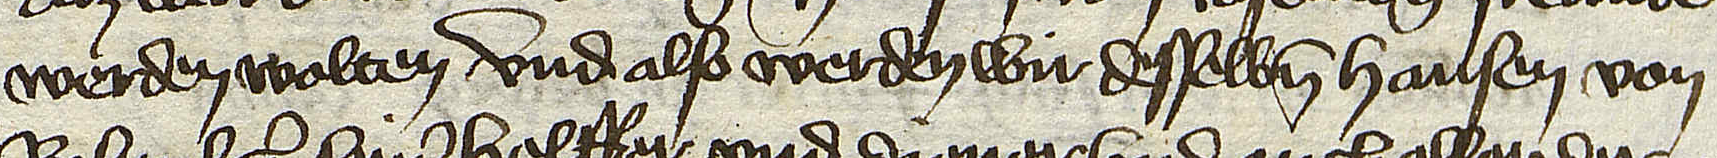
werden wolten / Vnd alſo werden wir deſſelbn* hanſen von
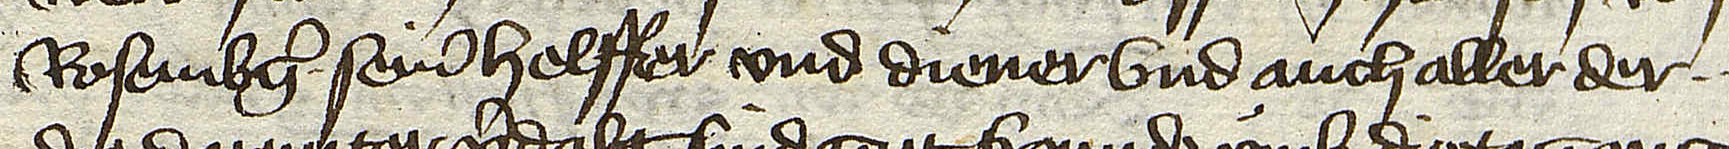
Roſembg* ſein* helffer vnd diener vnd auch aller der ~
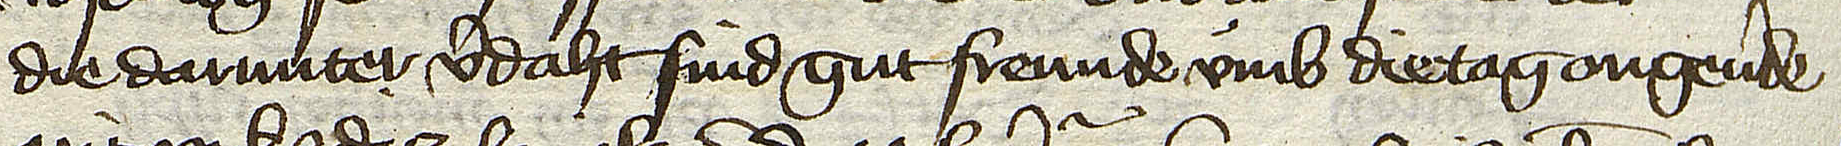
die darunter v*daht ſind gut freunde v̈mb dietag ongeude*
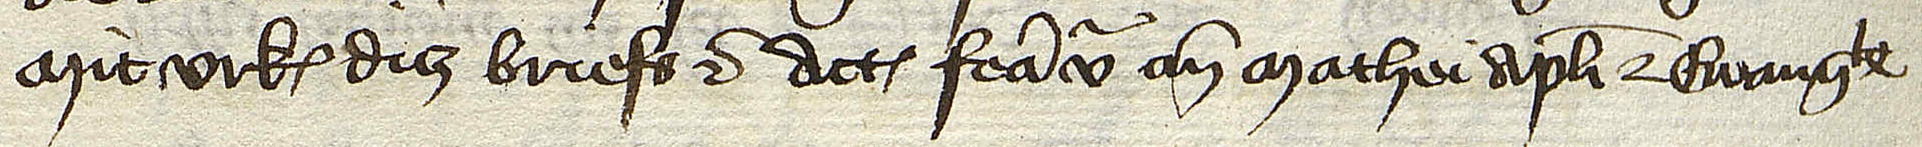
Mit vrk* dicʒ briefs ec* Act* fea* v* an* Mathei Apli* @ Ewange*
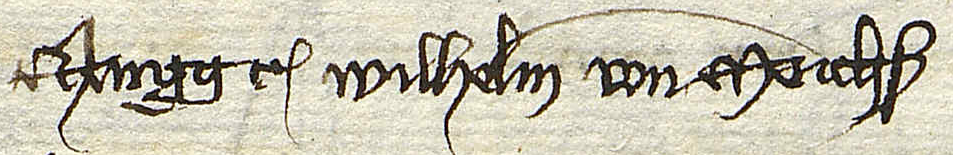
Marggr* wilhelm* von Meichſ*
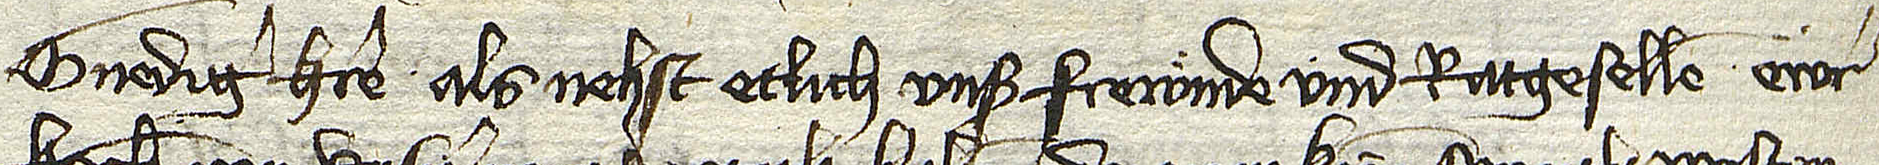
Gnedig* hre* . als nehſt etlich vnſ* freẅnde vnd Ratgeſelle* eẅr*
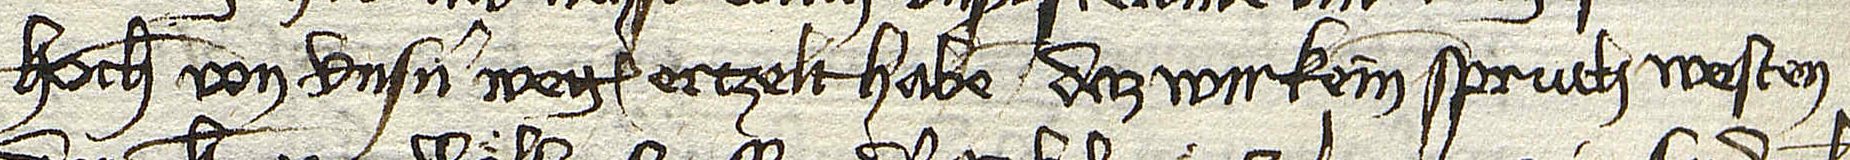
hoch* von Vnſ*n weg* ercʒelt habe* / daʒ wir kein* ſpruch weſten
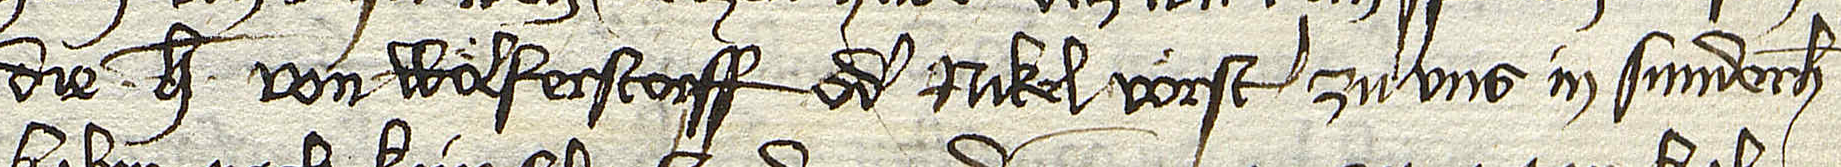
die . h* . von Wölferſtorff od* Nikel vörſt* ʒu vns in ſunderh*
